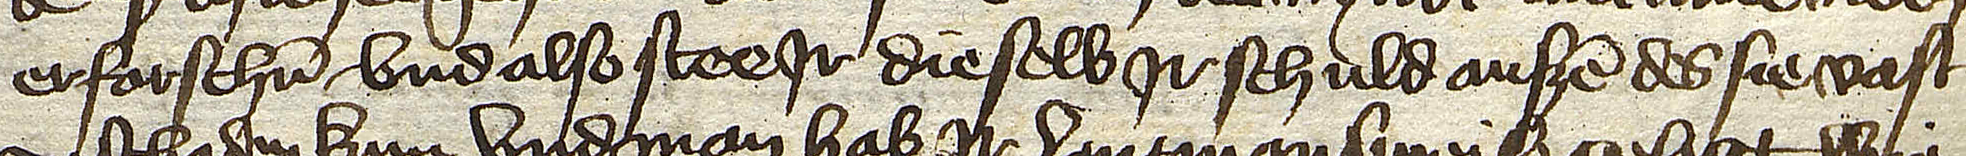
erforſchn* / vnd alſo ſtee Ir dieſelb Ir ſchuld auſʒe* des ſie vaſt
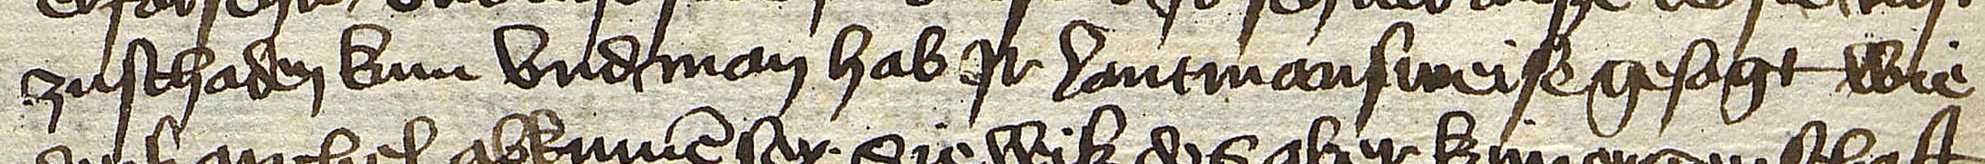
cʒuſchaden kum vnd man hab Ir lantmanſweiſe geſagt wie
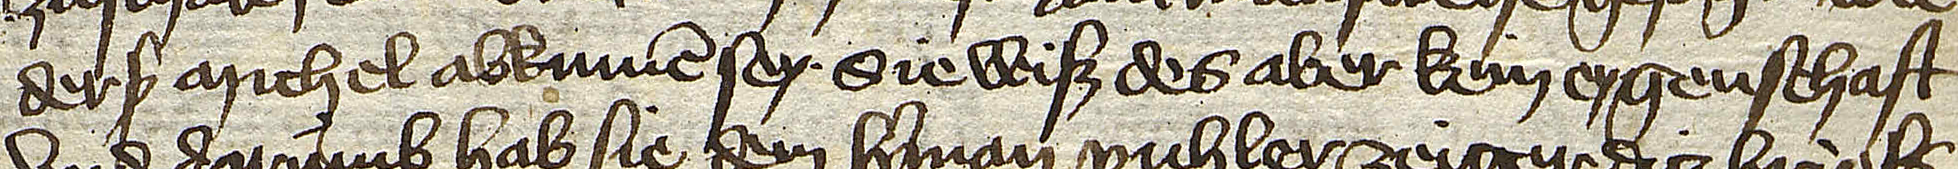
derſ* Michel abkume* ſey . Sie wiſʒ des aber kein eygenſchaft
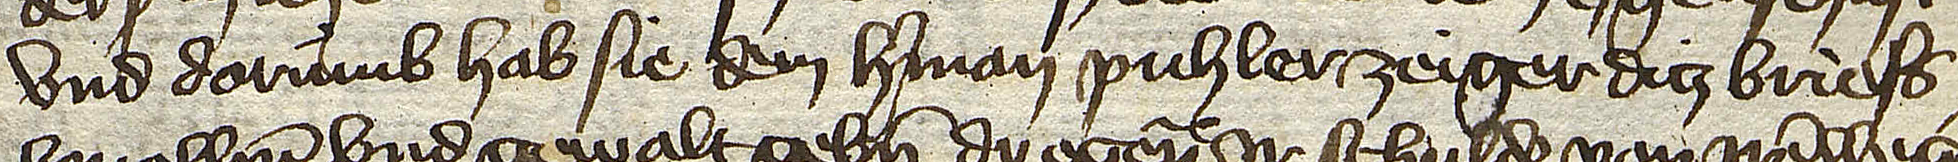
vnd darümb hab ſie dem h*man puhler cʒeiger dicʒ briefs
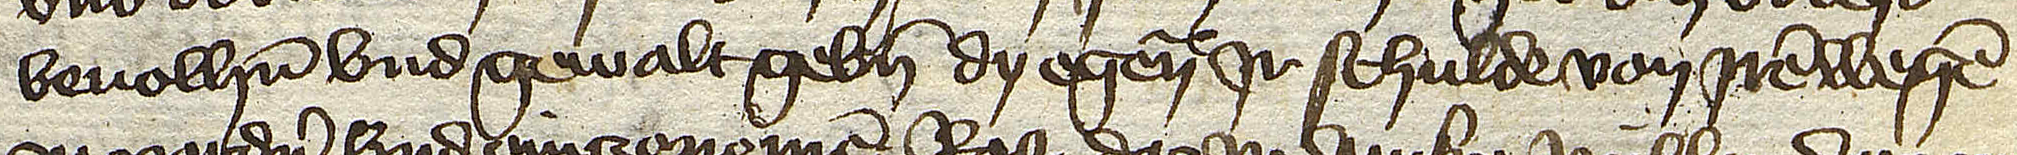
beuolhn* vnd gewalt gebn* dy egen* Ir ſchulde von Ire* wege*
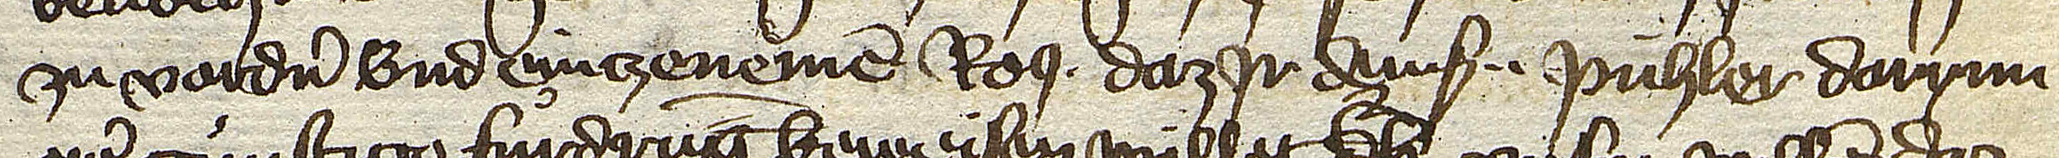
cʒu vordn* vnd eincʒeneme* Ro* / daʒ Ir demſ* ~ pühler darynn
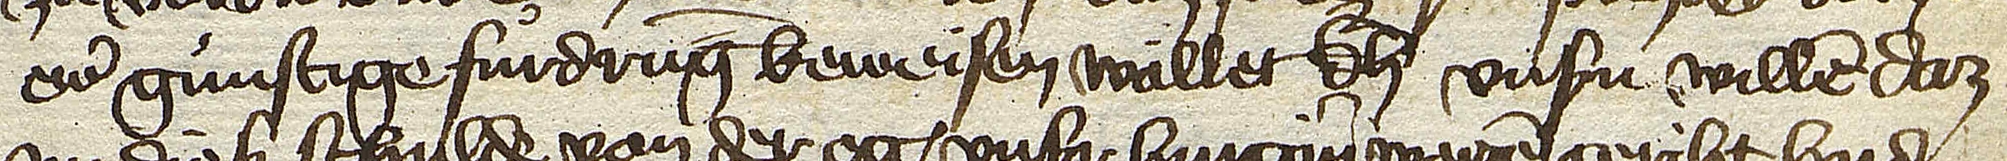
ew* günſtige fürdru*g beweiſen wöllet d*h vnſ*n wille* daʒ
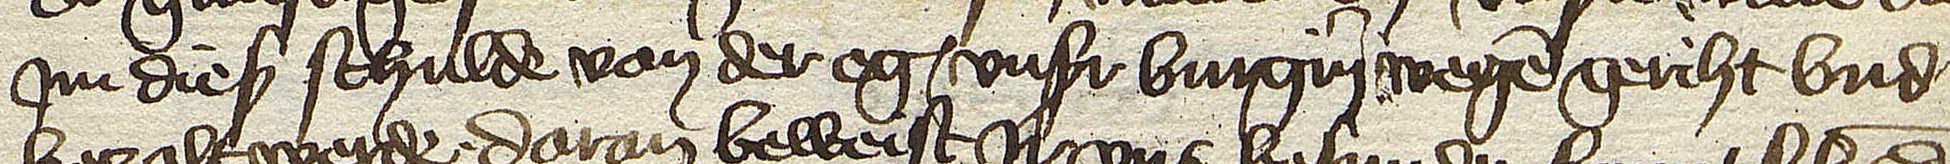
Im dieſ* ſchulde von der eg* vnſ*r burg*in wege* geriht vnd
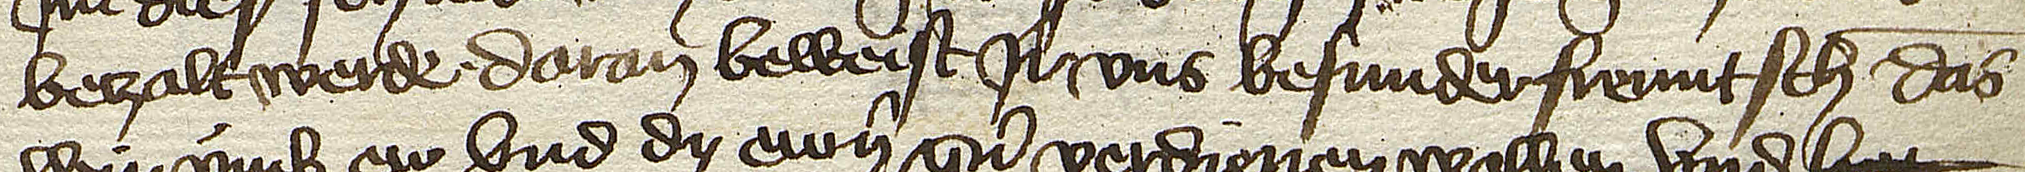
becʒalt werde . daran beweiſt Ir vns beſunder freuntſch* / das
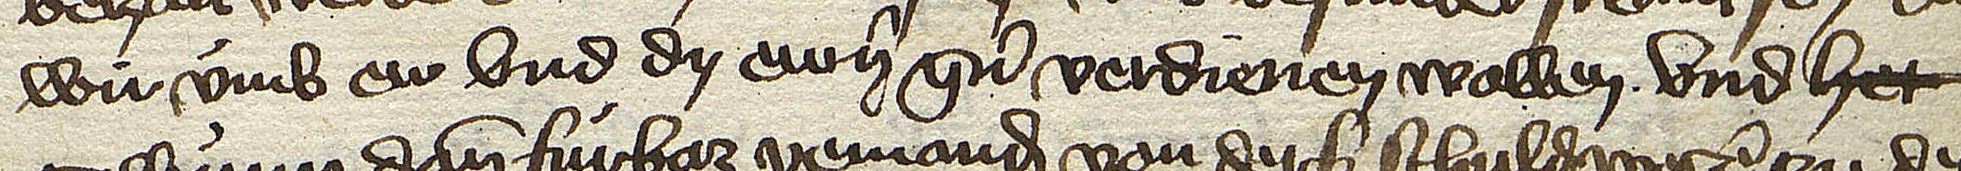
wir v̈mb ew vnd dy ew*n gn* verdienen wollen . vnd het
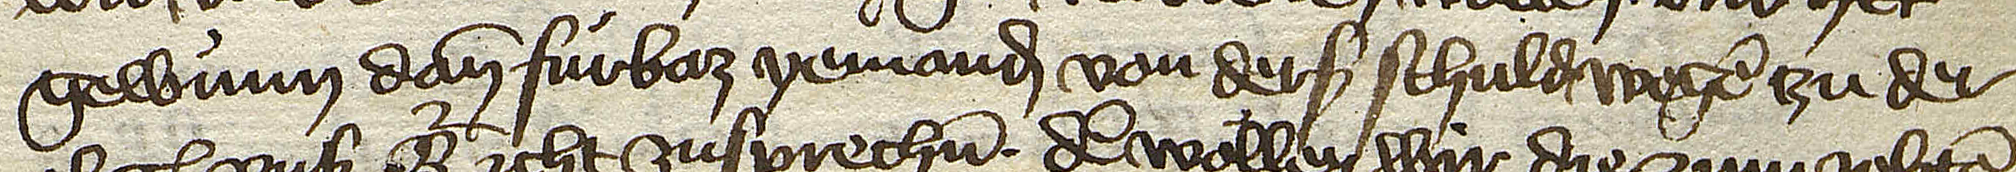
gewünn dan* fürbaʒ yemand* von derſ* ſchuldwege* cʒu der
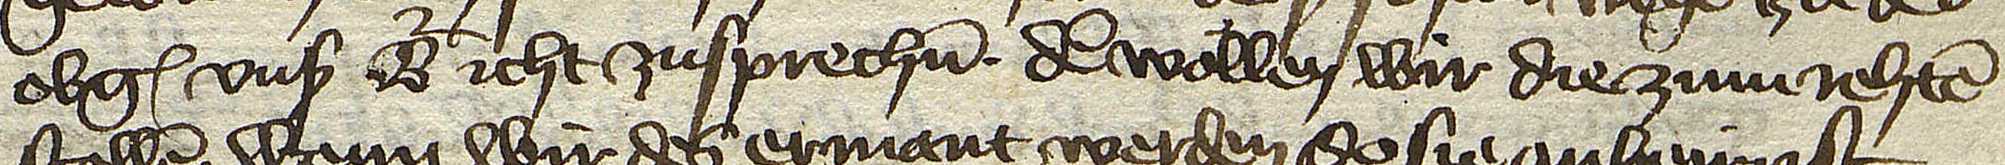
obg* vnſ* B* icht cʒuſprechn* . d* wollen wir die cʒum rehte*
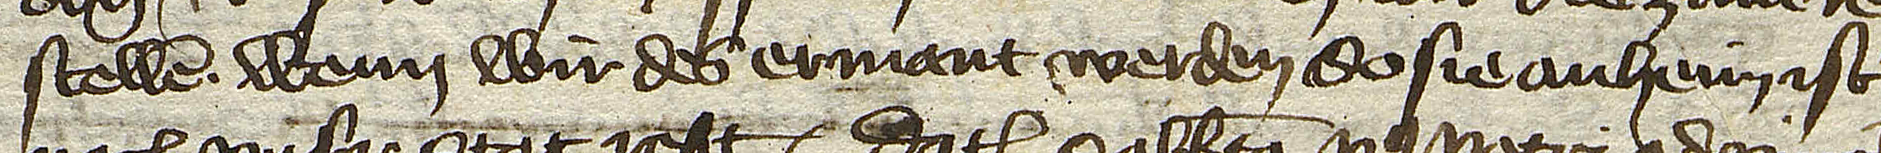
ſtelle* . wenn wir des ermant werden So ſie anheim iſt
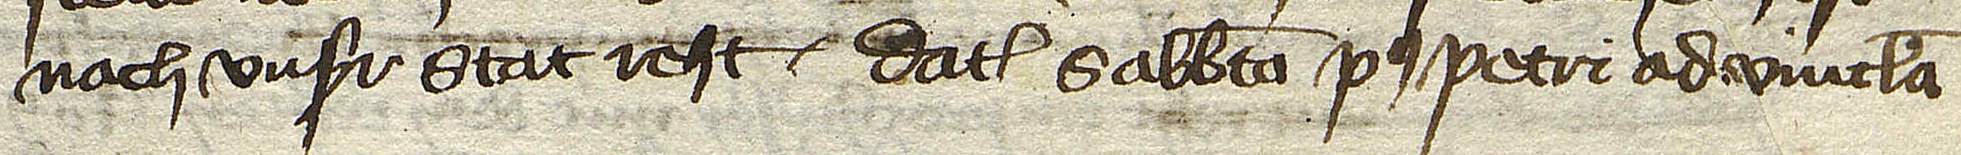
nach vnſ*r Stat reht / Dat* Sabbto* p* petri ad vincla*
